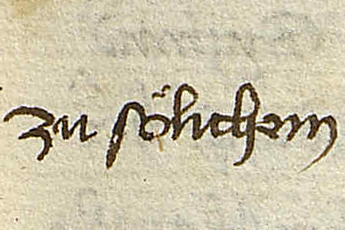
ʒu ſölichem
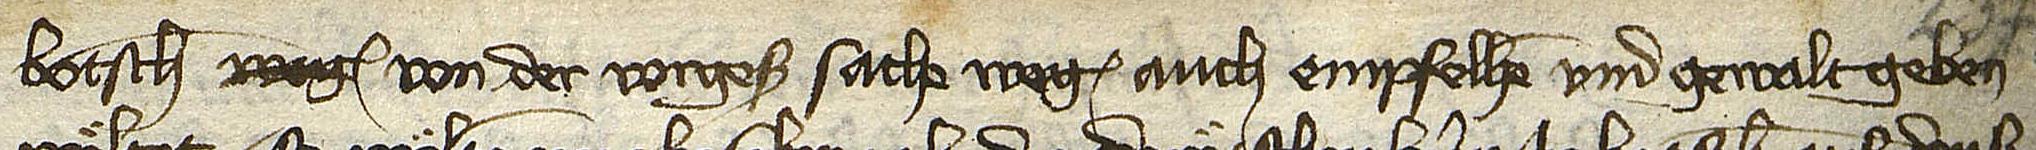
botſch* weg* von der vorgeſ* ſache weg* auch empfelhe* vnd gewalt geben
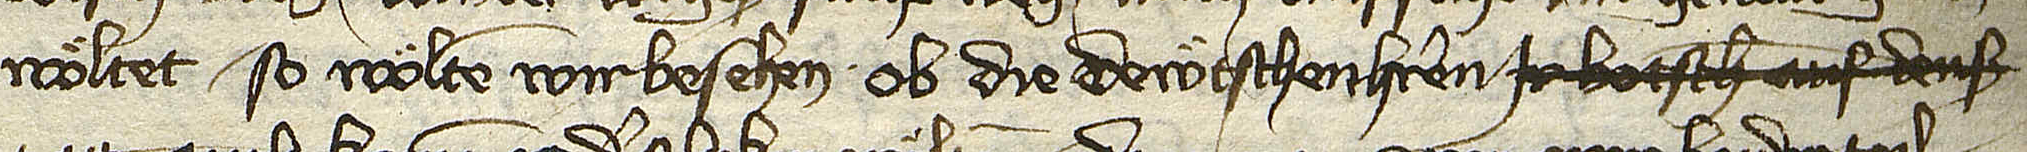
wöltet / ſo wölte* wir beſehen . ob die Dewtſchen h*ren Ir botſch* auf denſ*
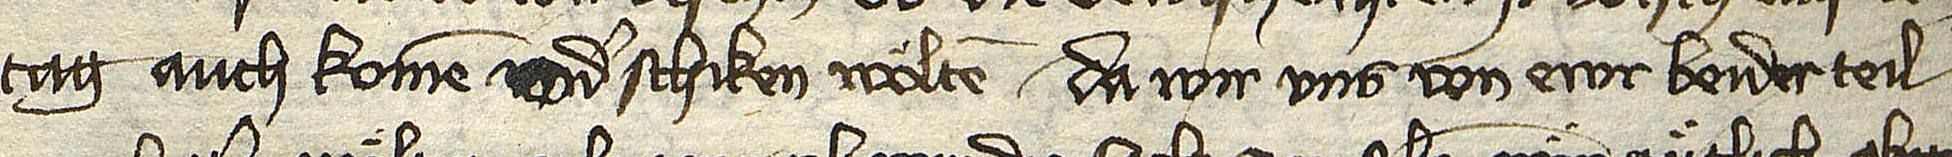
tag auch kome* vnd ſchiken wölte* / da wir vns von ewr beider teil
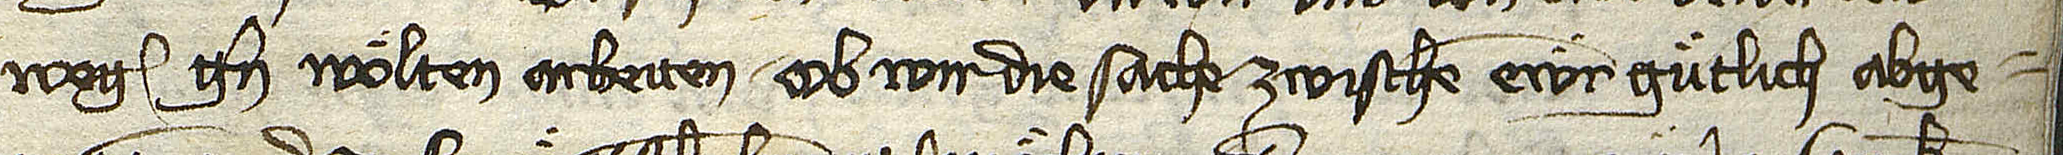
weg* g*n wölten arbeiten / ob wir die ſache ʒwiſche* ewr gütlich abge =
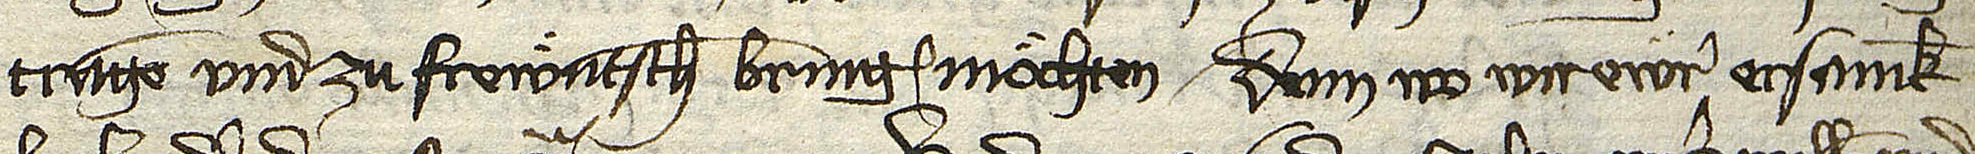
trage* vnd ʒu frewntſch* bring* möchten / Denn wo wir ew*r erſamk*
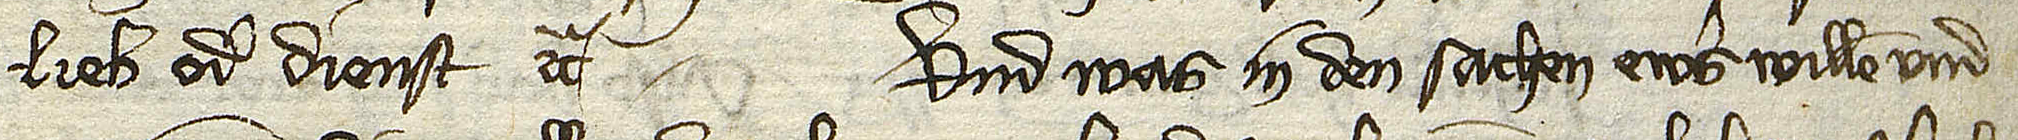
lieb od* dienſt ec* / Vnd was in den ſachen ew*s wille* vnd
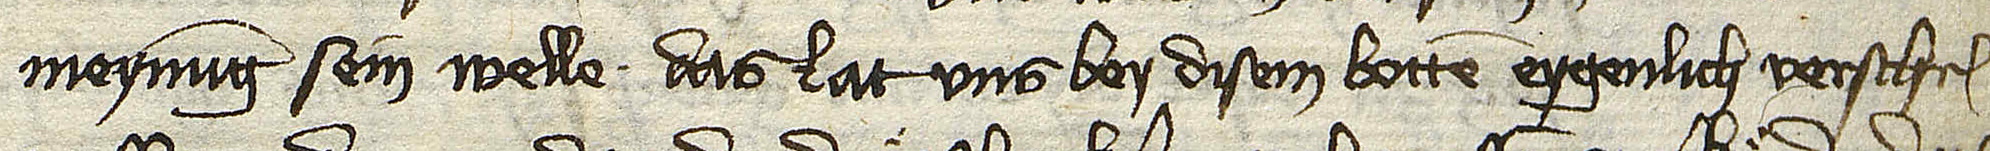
meynu*g ſein welle . das lat vns bey diſem botte* eygenlich verſchr*
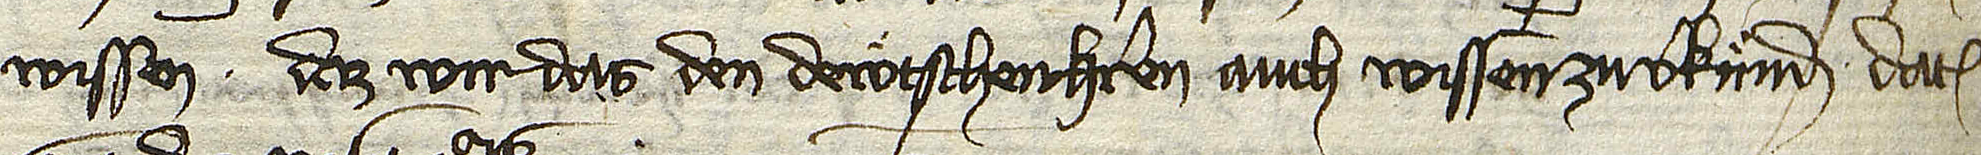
wiſſen . daʒ wir das den dewtſchenh*ren auch wiſſen ʒu v*künd* . dat*
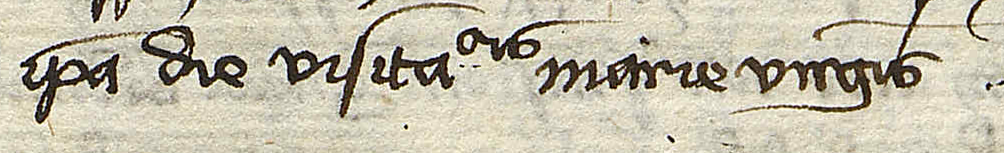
ipa* die viſita* marie virg*is
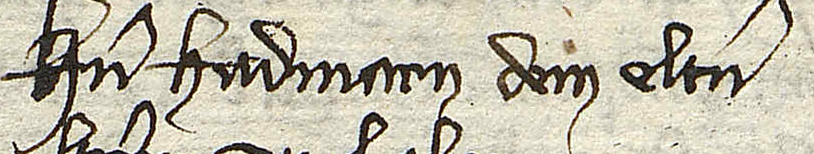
H*n hadmarn dem elt*n
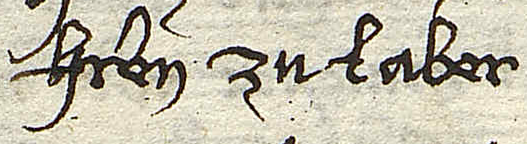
h*ren ʒu laber
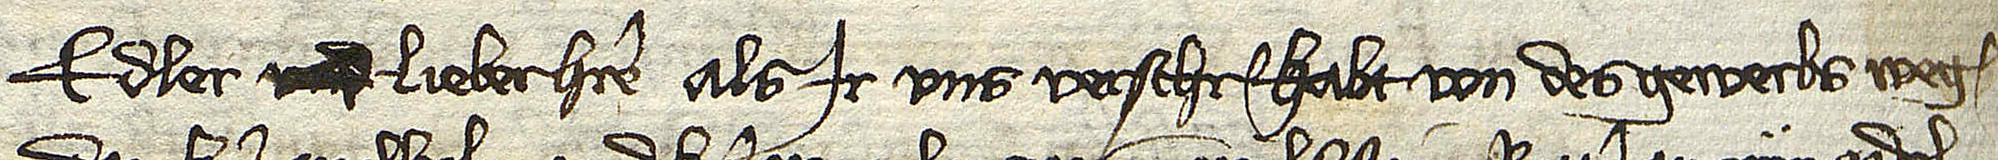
Edler vnd lieber h*re als Ir vns verſchr* habt von des gewerbs weg*
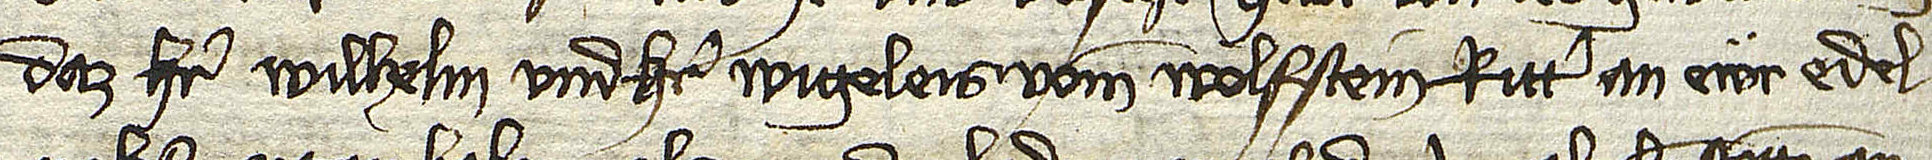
daʒ h*r wilhelm vnd h*r wigeleis vom* wölfſtein Ritt* an ew*r edel
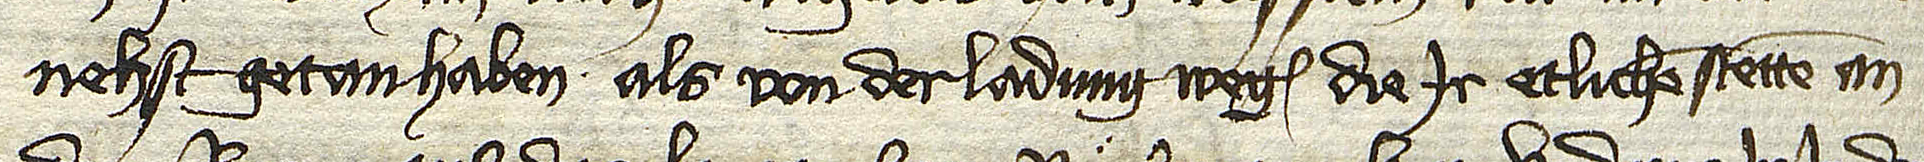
nehſt getan haben . als von der ladung weg* die Ir etliche* ſtette* an
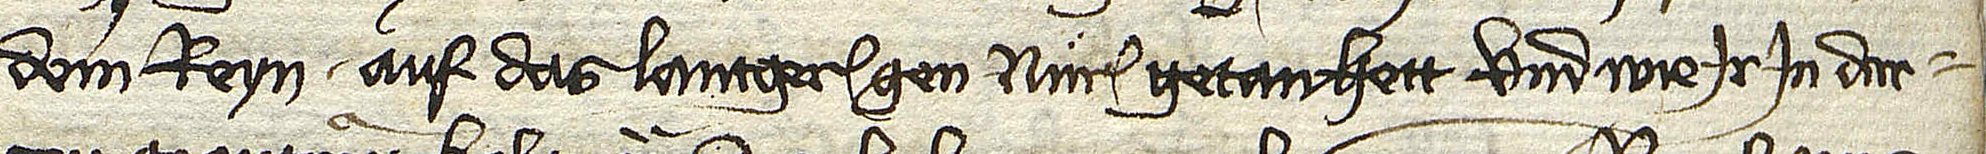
dem Reyn / auf das lantger* gen Nür* getan hett Vnd wie Ir In dar =
